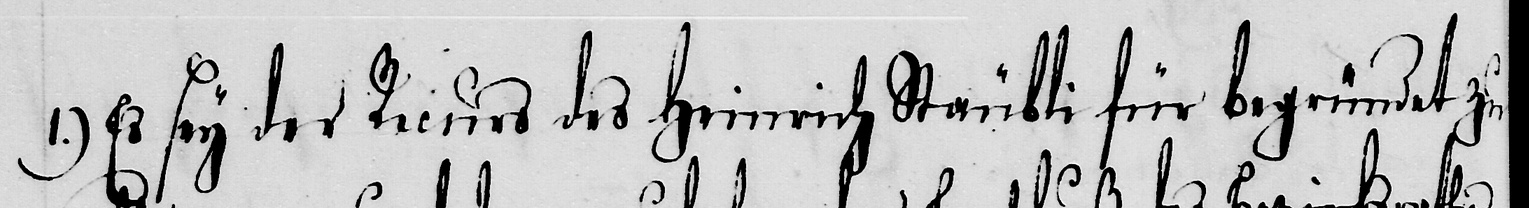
1.) Es sey der Recurs des Heinrich Stäubli für begründet zu
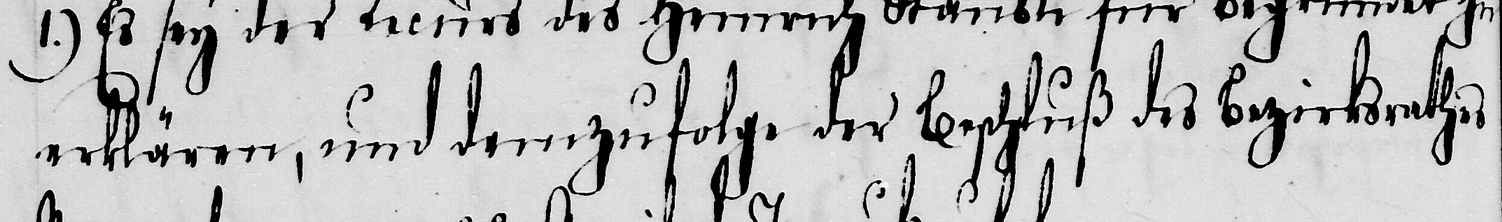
erklären, und demzufolge der Beschluß des Bezirksrath¬
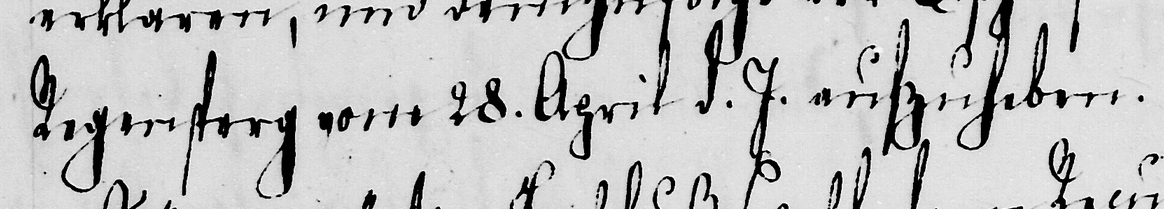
Regensberg vom 28. April d. J. aufzuheben.
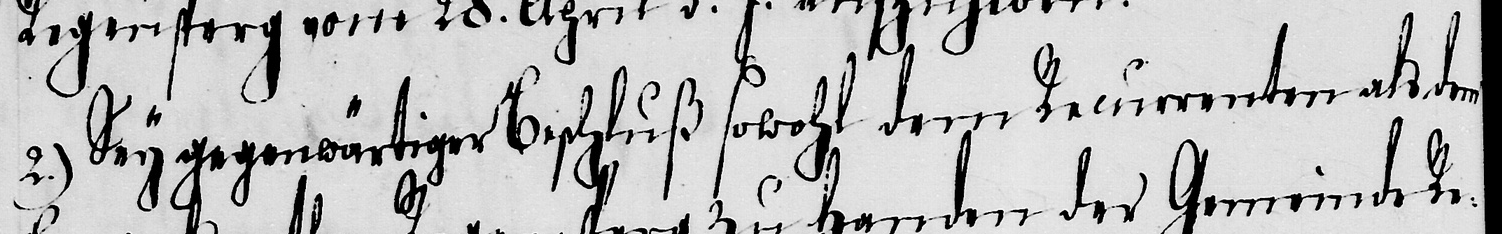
2.) Sey gegenwärtiger Beschluß sowohl dem Recurrenten als dem
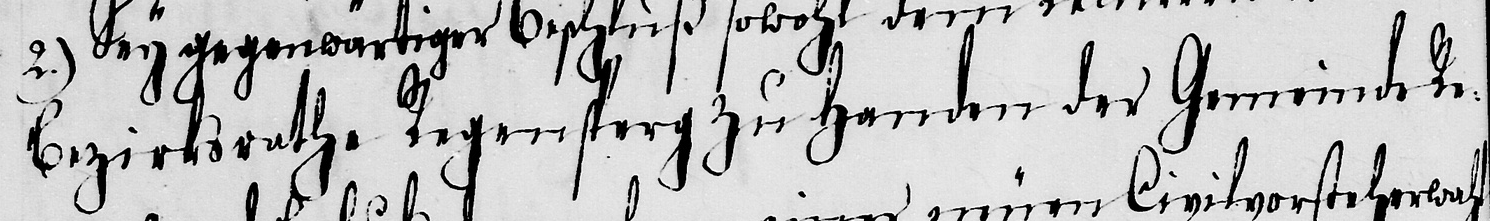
Bezirksrathe Regensperg zu Handen der Gemeinde Re¬
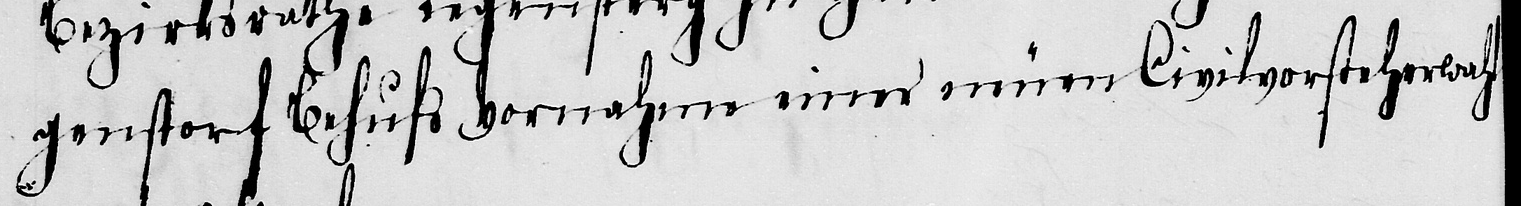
genstorf Behufs Vornahme einer neuen Civilvorsteherwahl
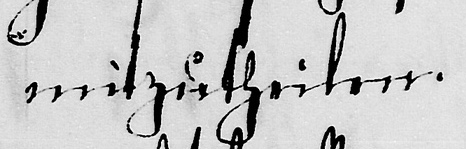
mitzutheilen.
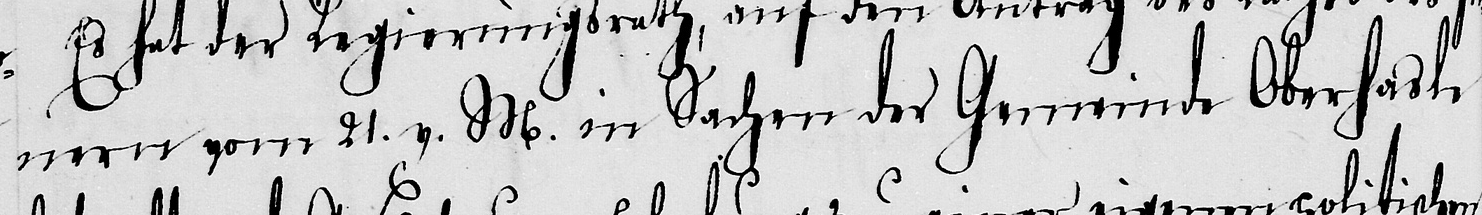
nnern vom 21. v. M. in Sachen der Gemeinde Oberhasle
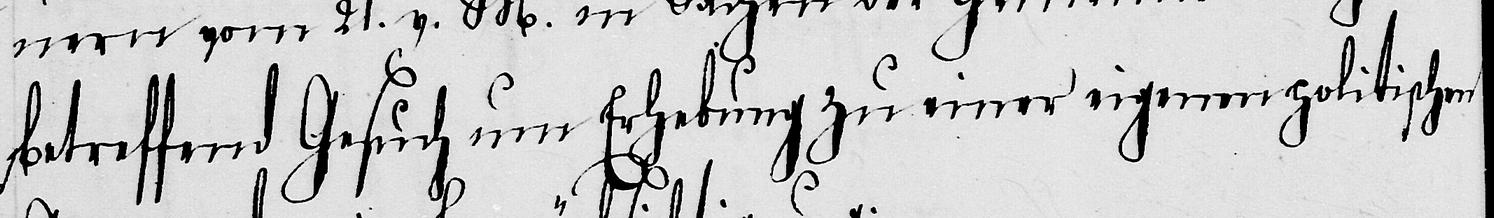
betreffend Gesuch um Erhebung zu einer eigenen politischen
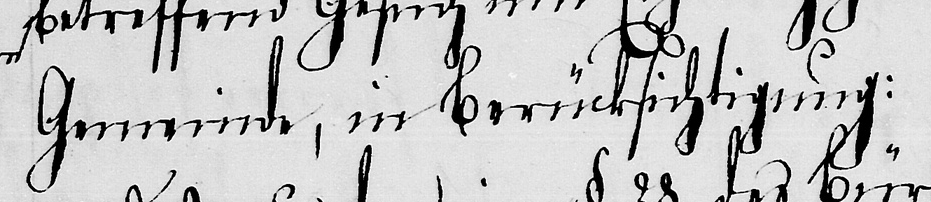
Gemeinde, in Berücksichtigung:
